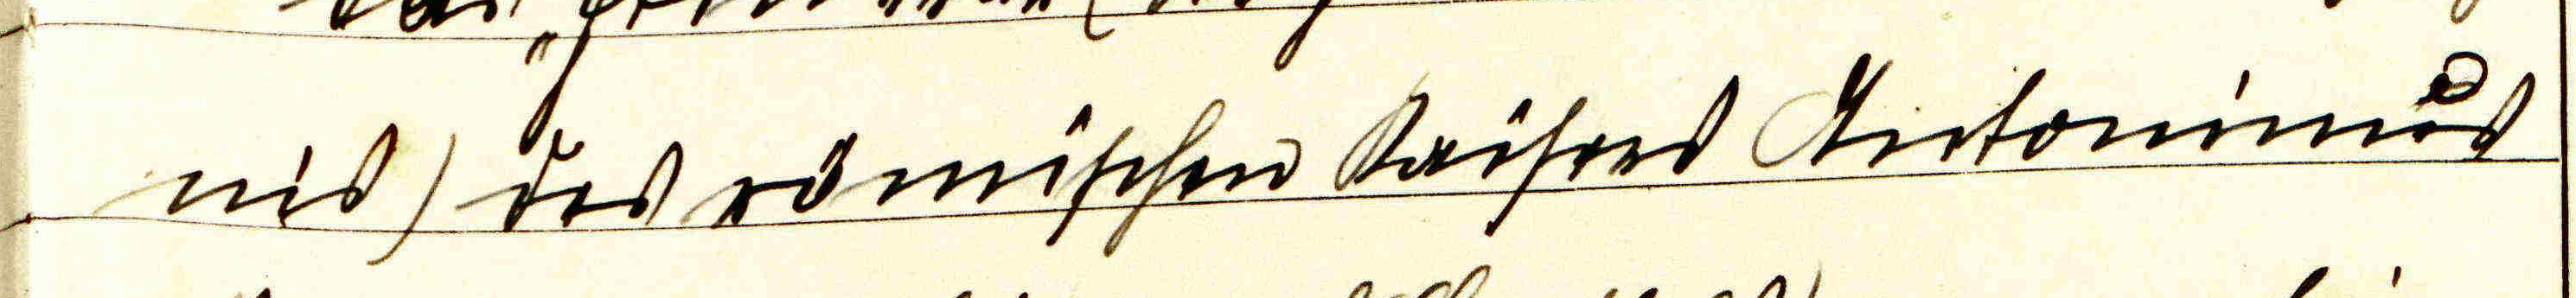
nis) des römischen Kaisers Antoninus
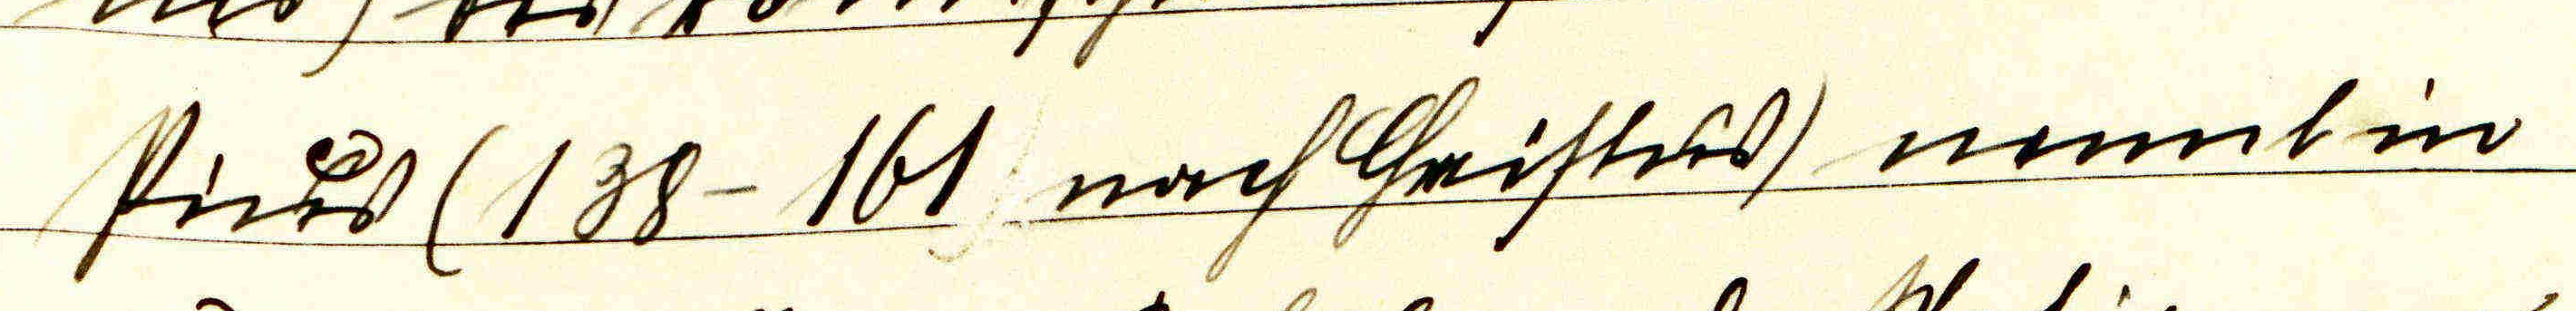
Pius (138 – 161 nach Christus) nennt in
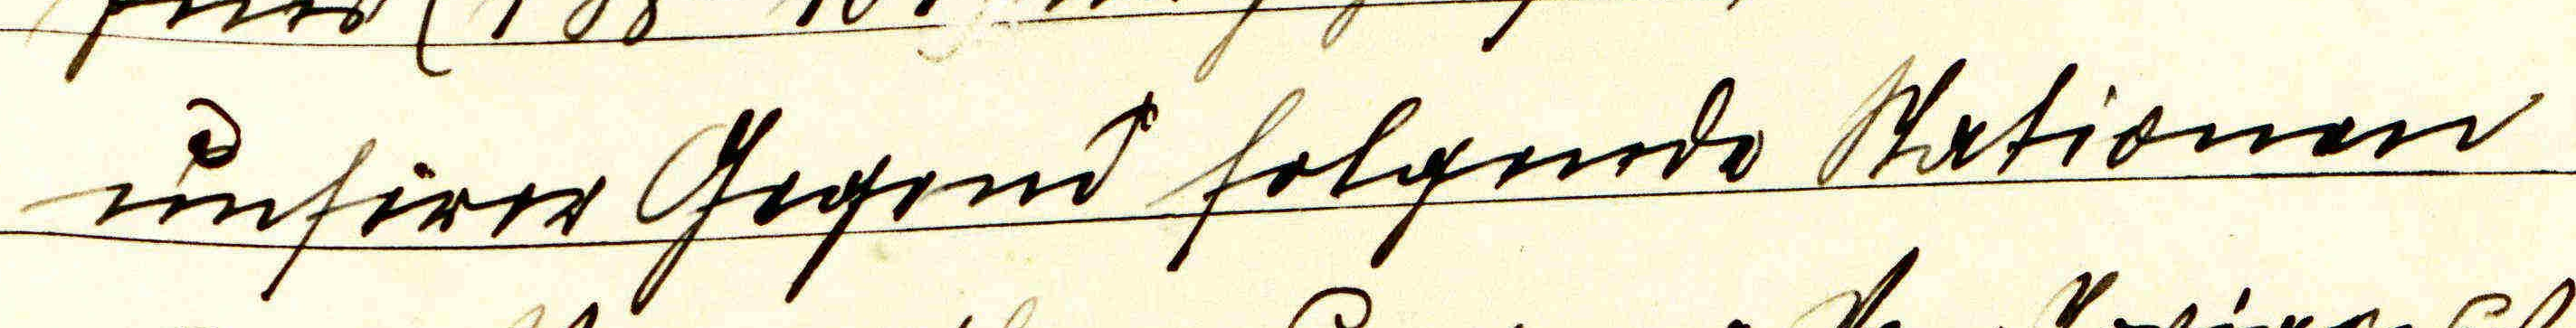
unserer Gegend folgende Stationen
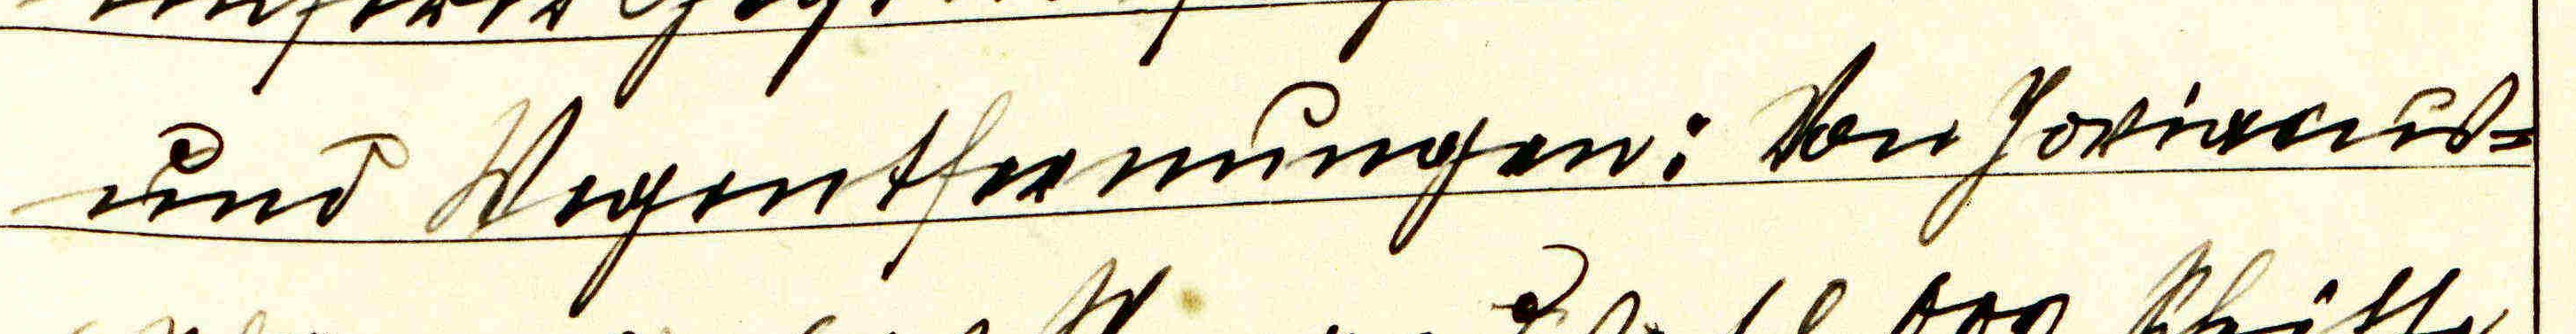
und Wegentfernungen: Von Ioviacus-
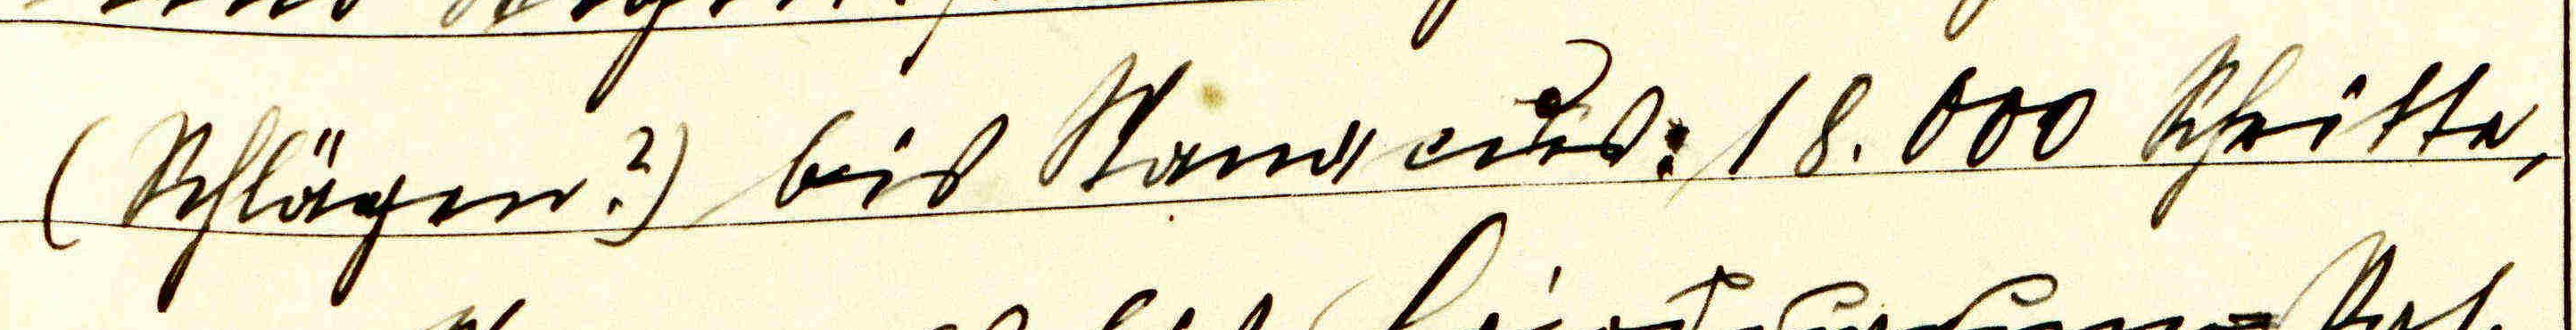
(Schlägen ?) bis Stanacus: 18.000 Schritte,
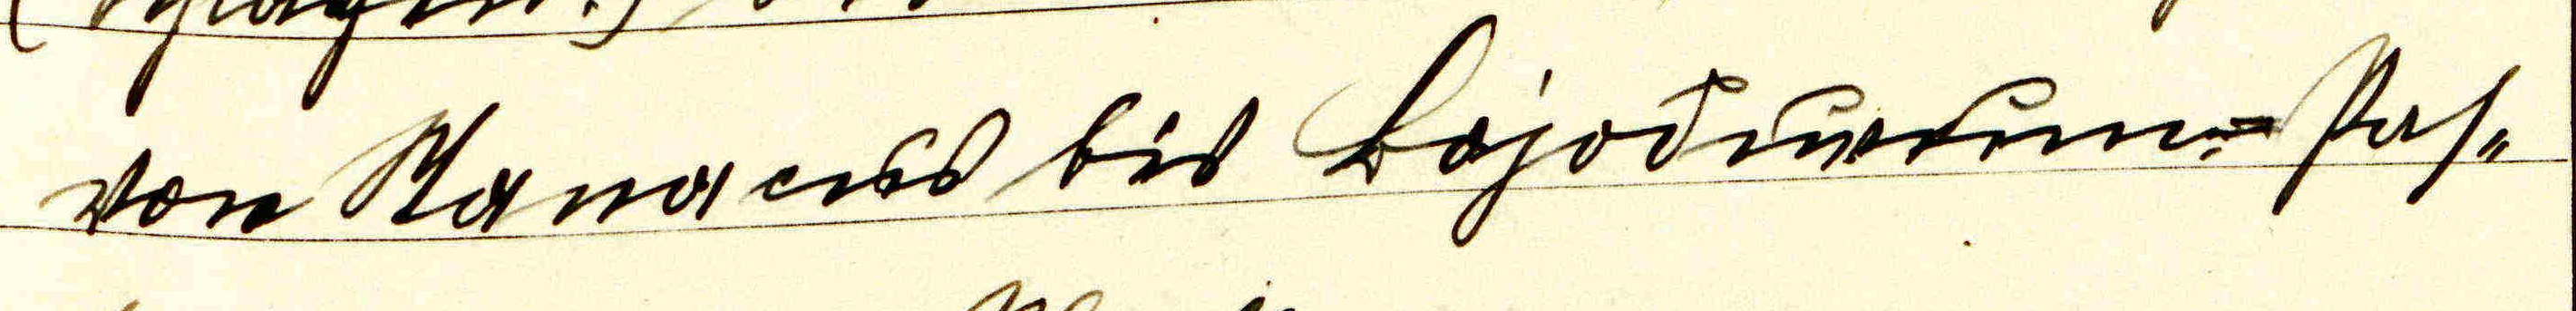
von Stanacus bis Bojod??? – Pas
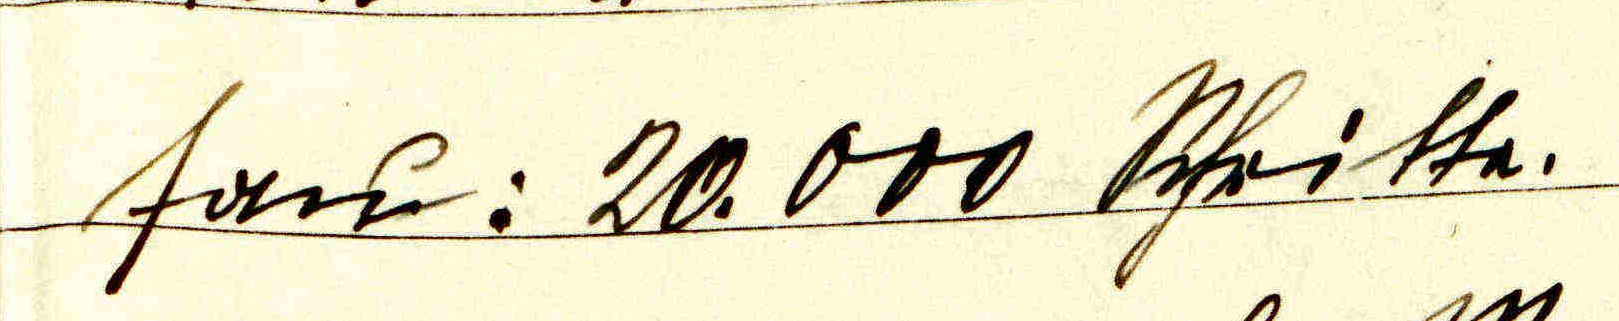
sau: 20.000 Schritte.
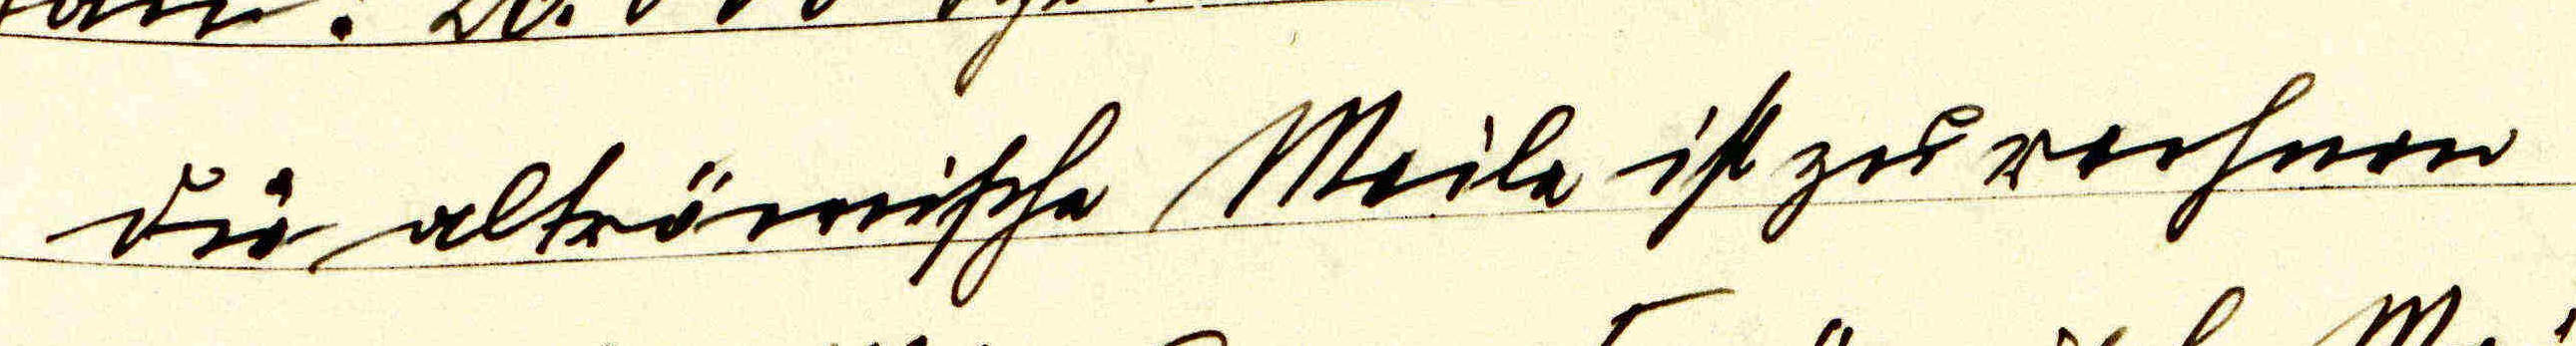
Die altrömische Meile ist zu rechnen
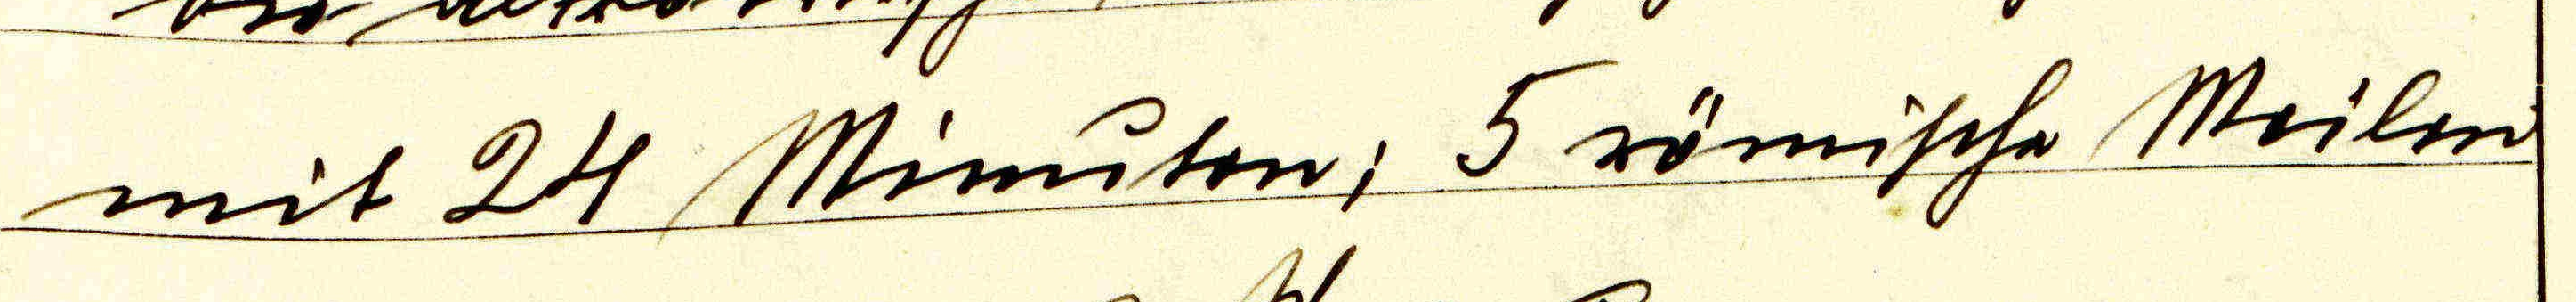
mit 24 Minuten; 5 römische Meilen
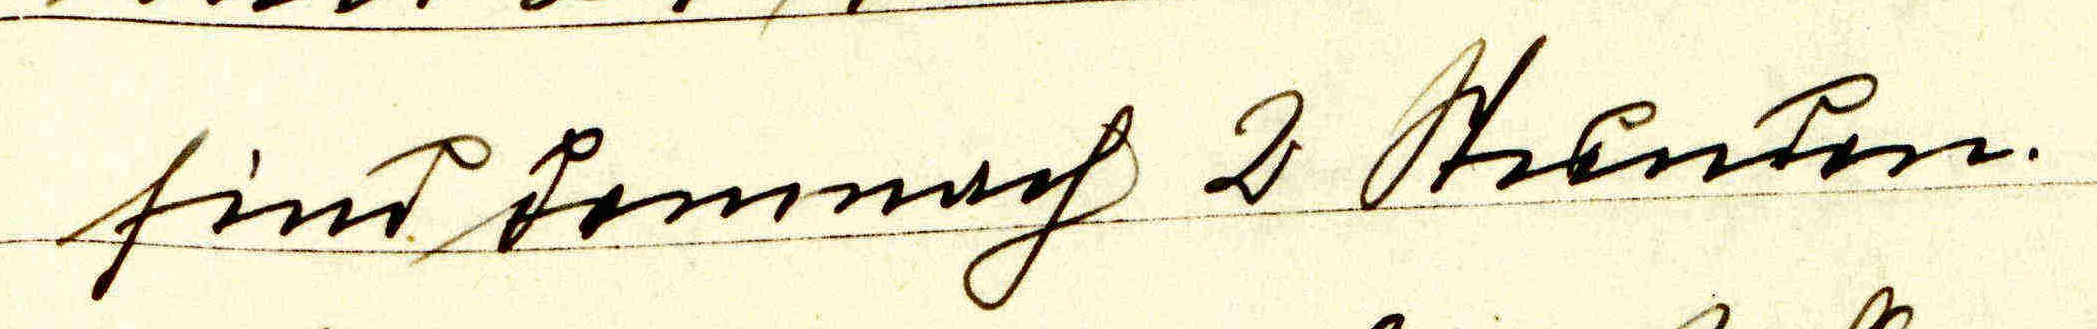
sind demnach 2 Stunden.
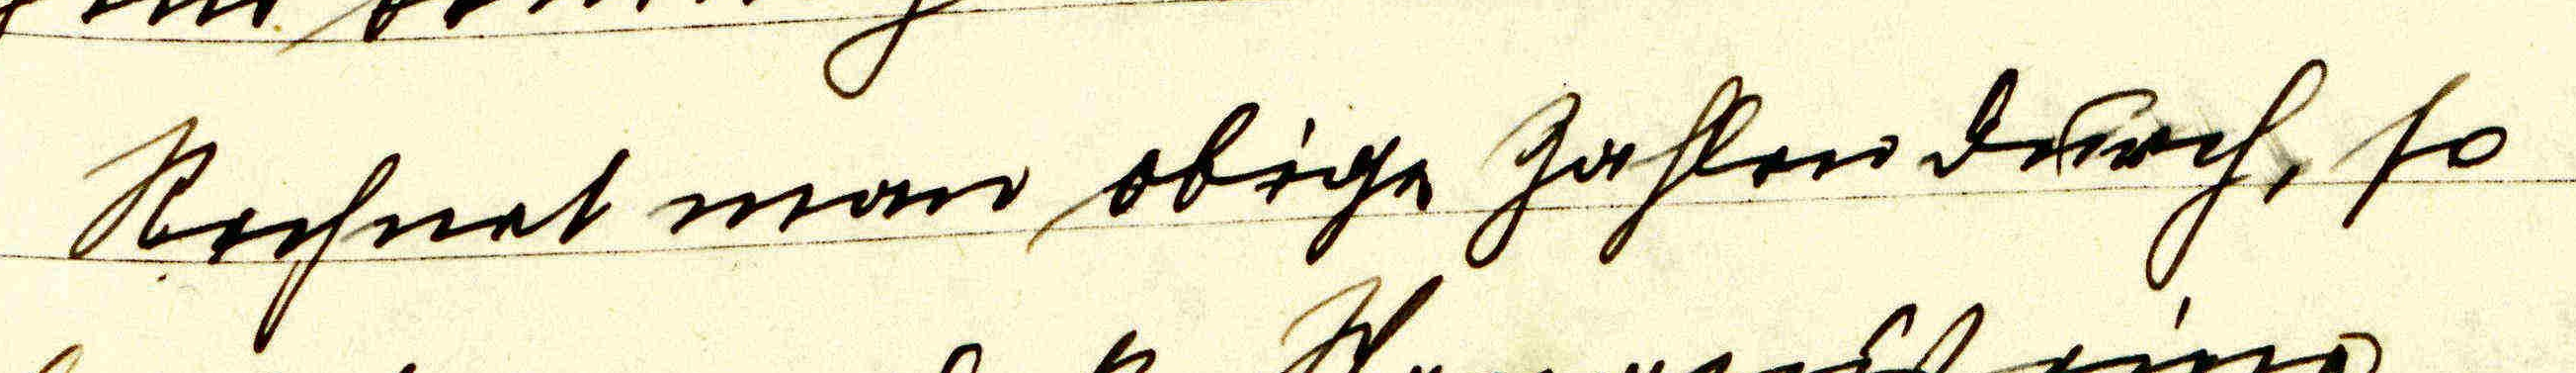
Rechnet man obige Zahlen durch, so
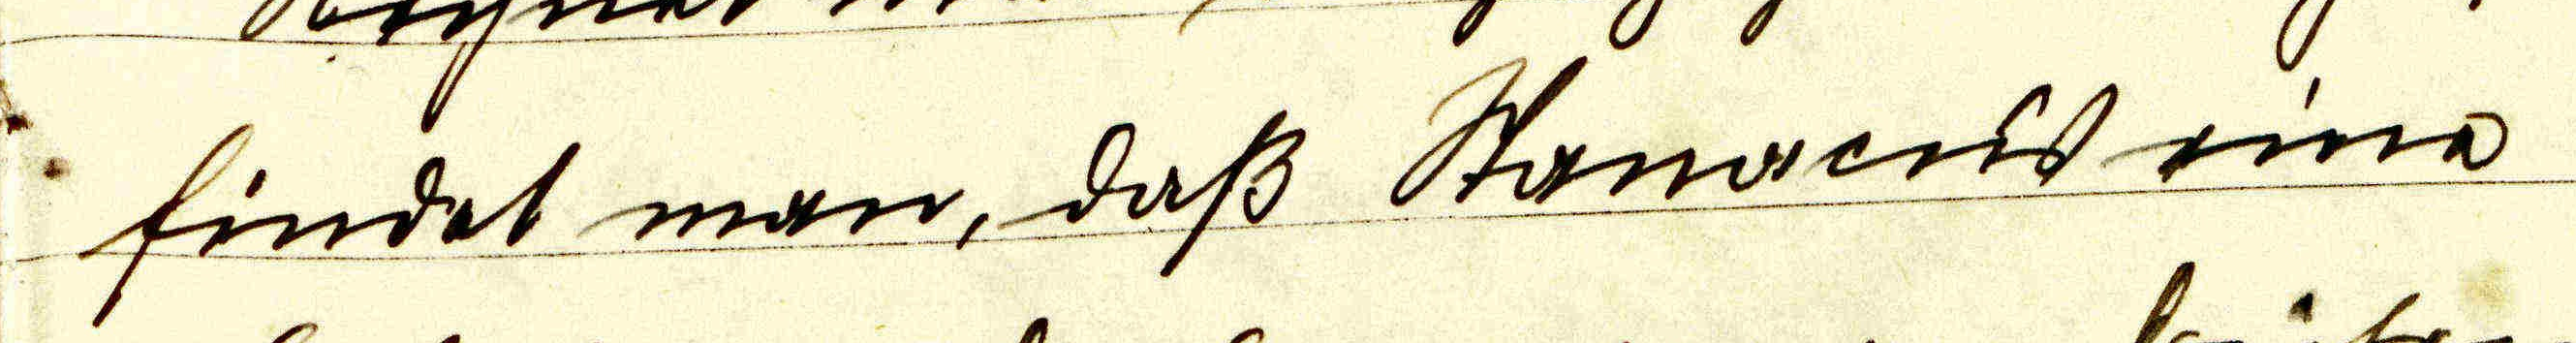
findet man, daß Stanacus eine
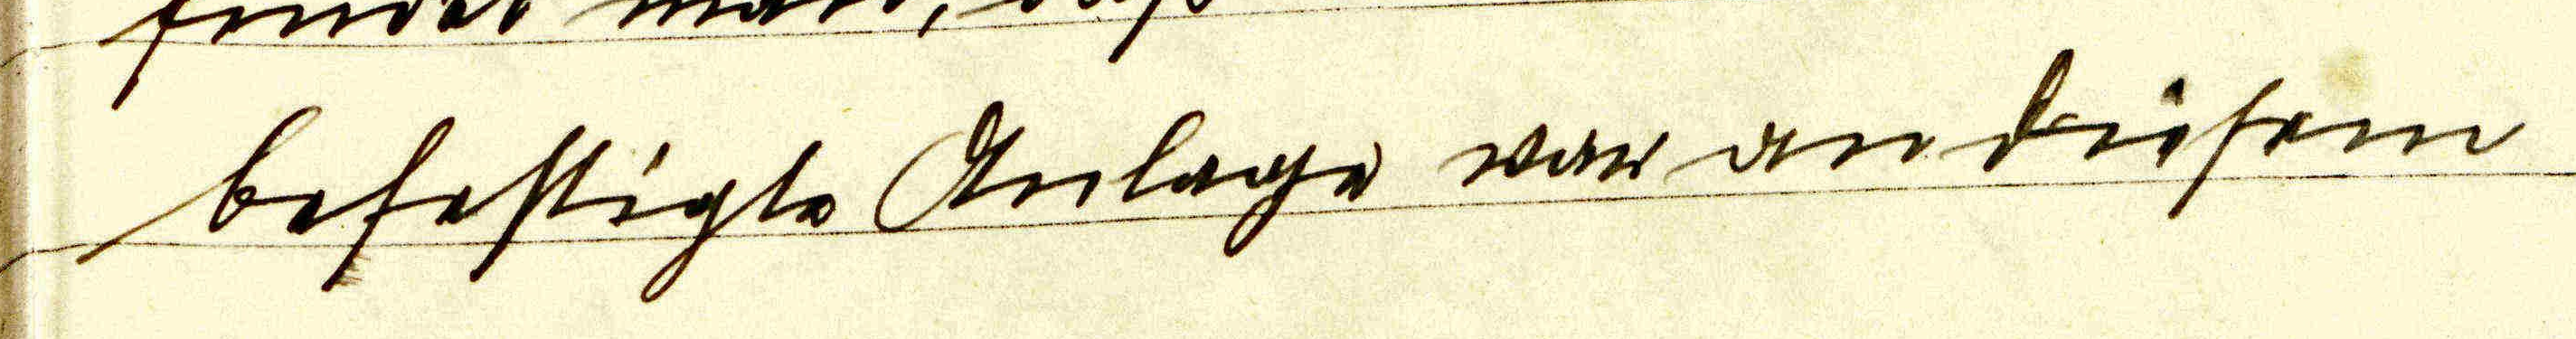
befestigte Anlage war an diesem
